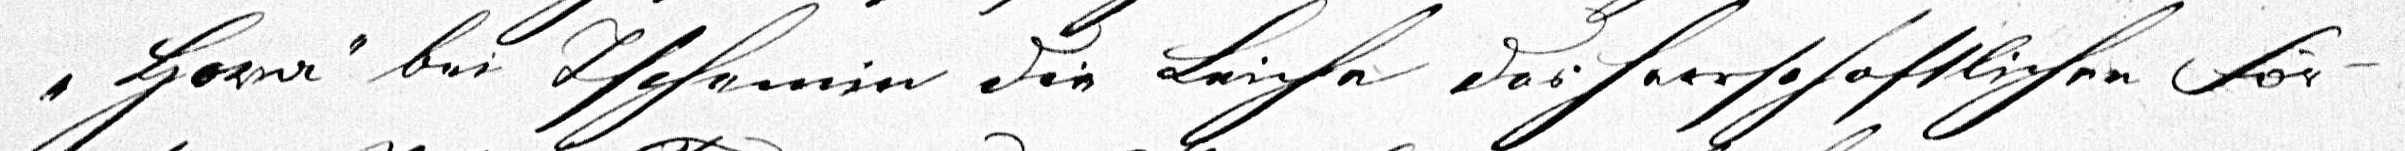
„Hora“ bei Tschemin die Leiche des herrschaftlichen För¬
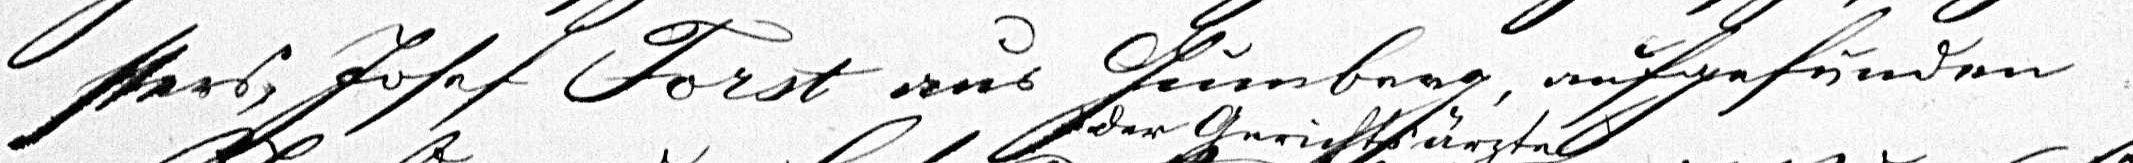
sters, Josef Forst aus Gumberg, aufgefunden.
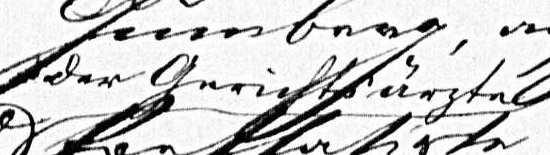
der Gerichtsärzte
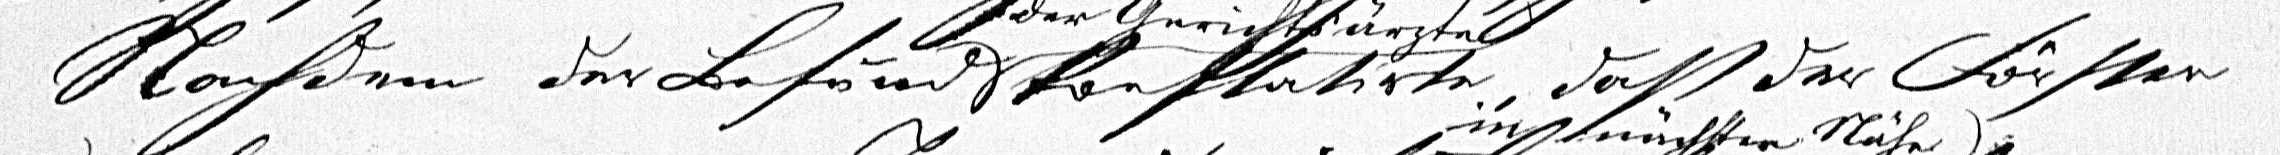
Nachdem der Befund konstatirte, daß der Förster
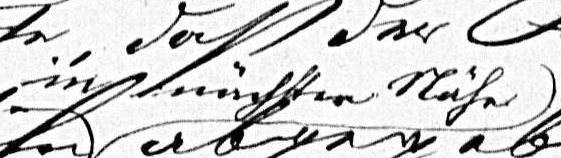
in nächster Nähe
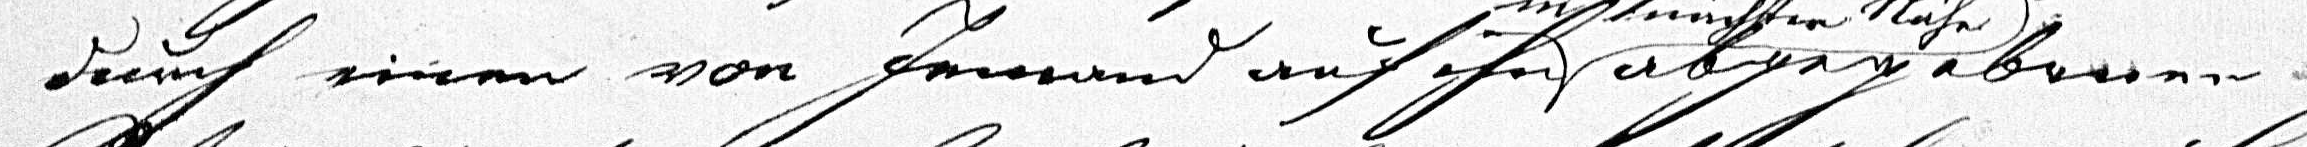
durch einen von Jemand auf ihn abgegebenen
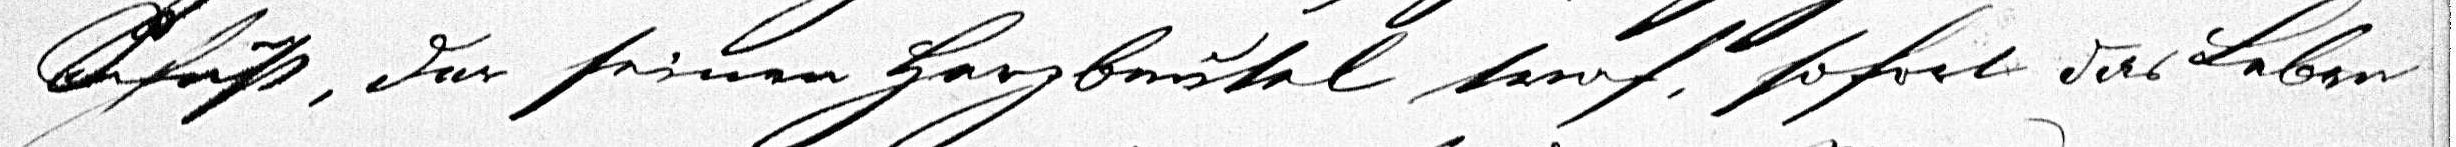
Schlüß, der seinen Herzbrustel traf, sofort das Leen
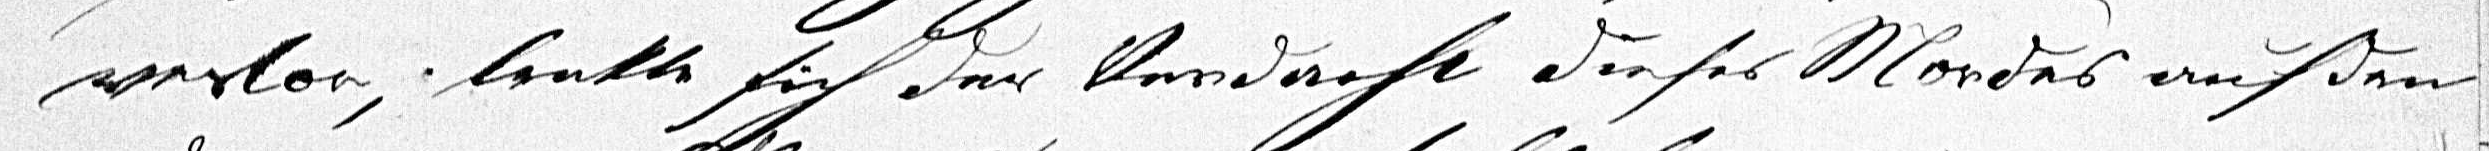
verlor; lenkte sich der Verdacht dieses Mordes auf den
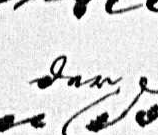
der
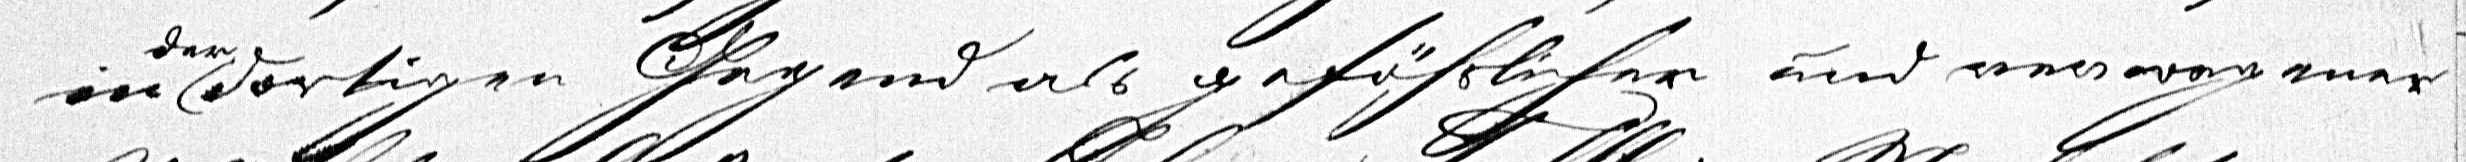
in dortigen Gegend als gefährlicher und verwegener
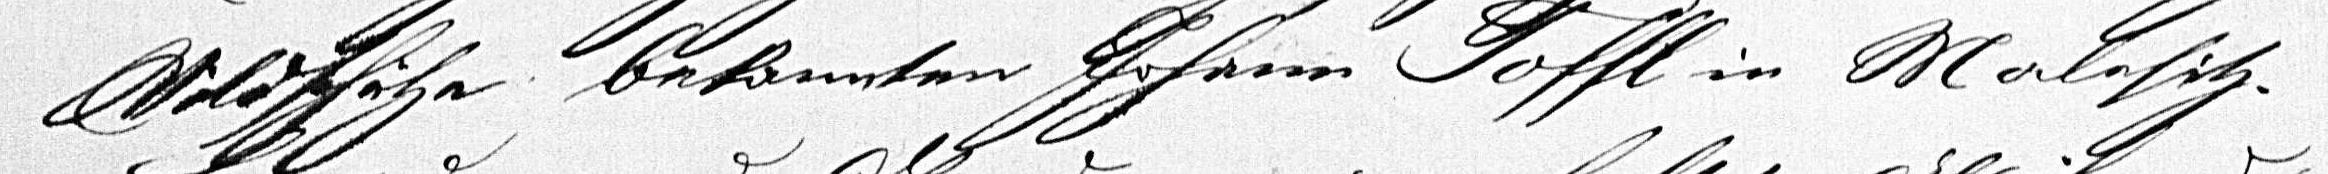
Waldschütze bekannten Johann Toffl in Malesitz.
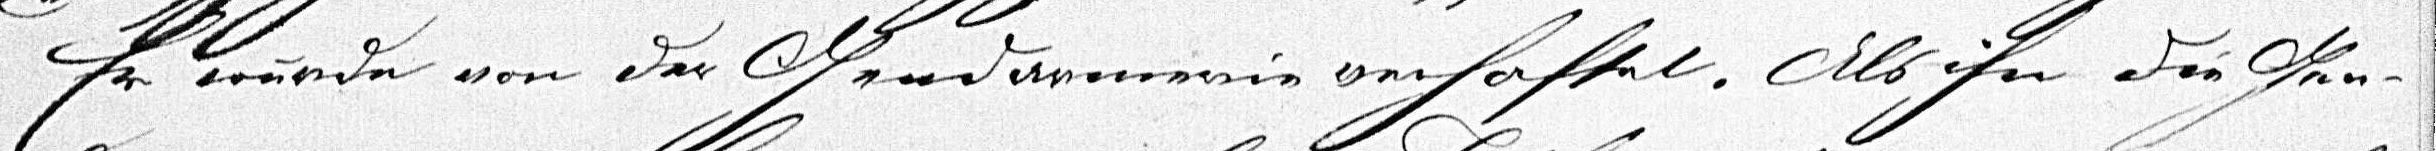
Er würde von der Gendarmerie verhaftet. Als ihn die Gen¬
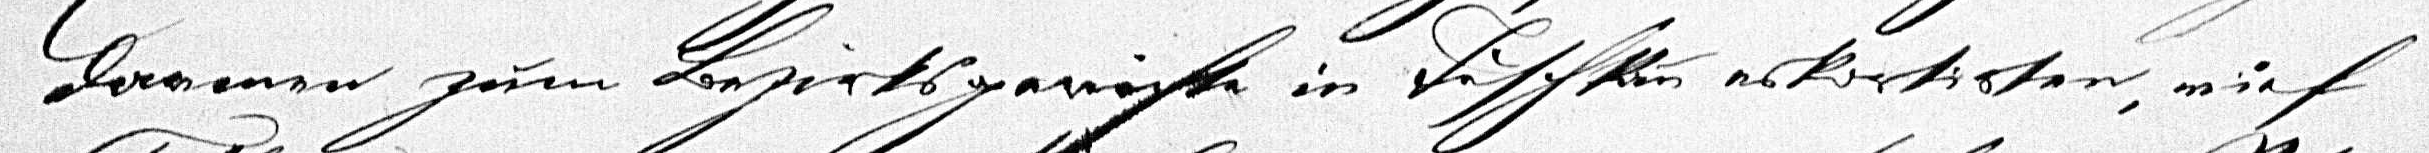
darmen zum Bezirksgerichte in Tuschkin eskortirten, rief
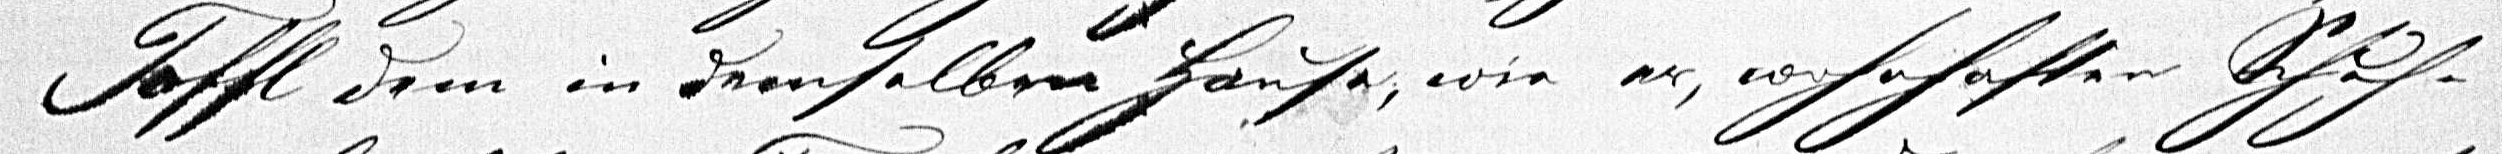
Toffl dem in demselben Hause, wie er, wohnhaften Schuh¬
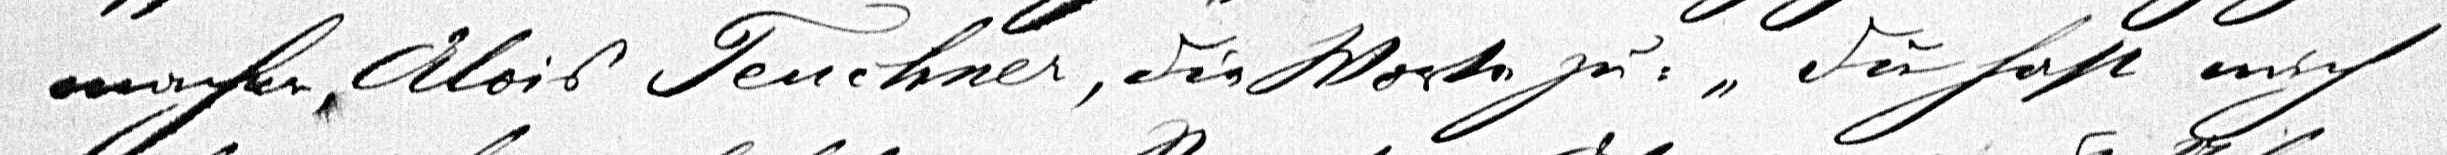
macher, Alois Teuchner, die Worte zu: „Du hast mich
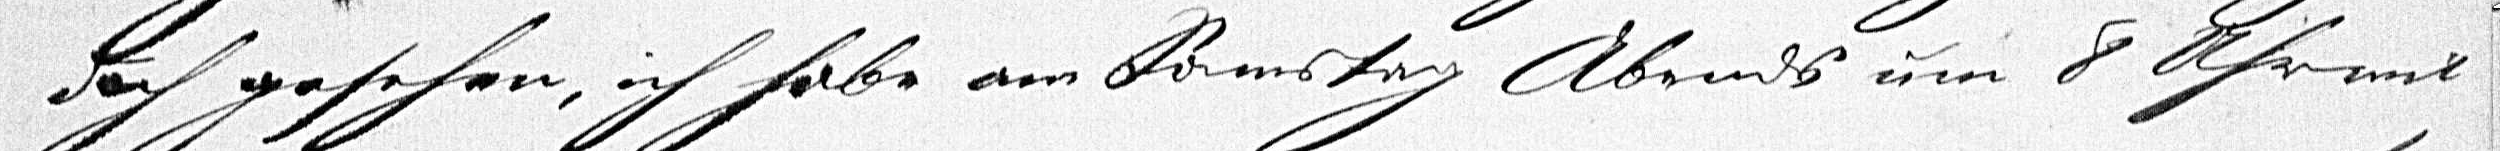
doch gesehn, ich habe am Samstag Abends um 8 Uhr mit
